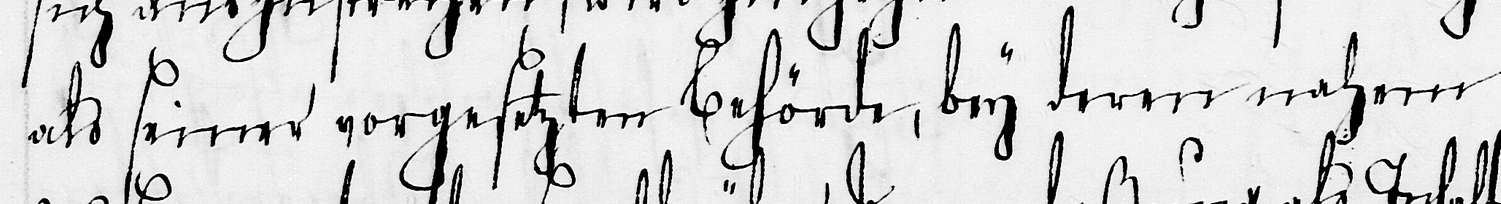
als seiner vorgesetzten Behörde, bey deren nahem
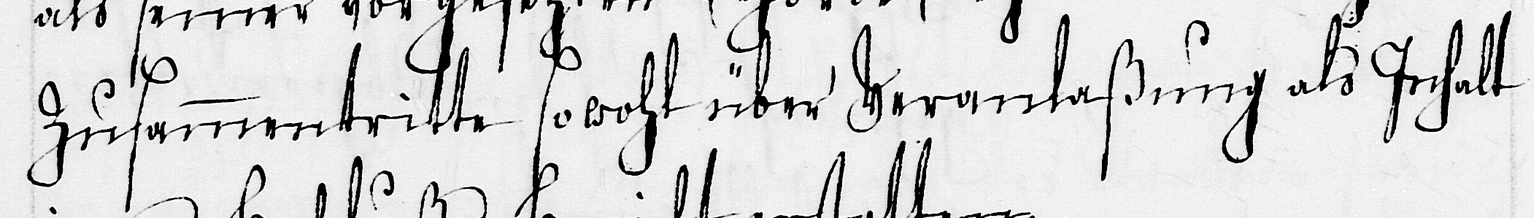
Zusammentritte sowohl über Veranlaßung als Inhalt
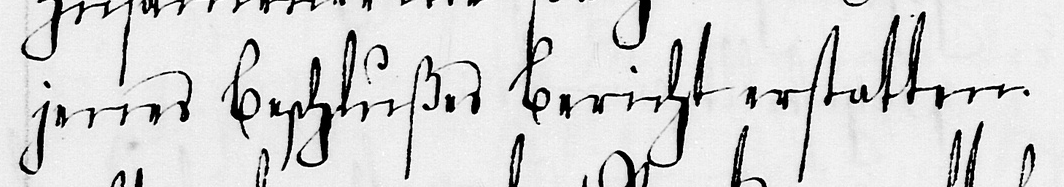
jenes Beschlußes Bericht erstatten.
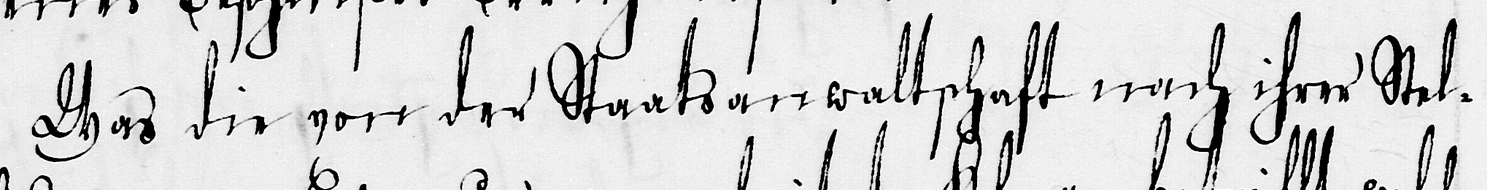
Was die von der Staatsanwaltschaft nach ihrer Sta¬
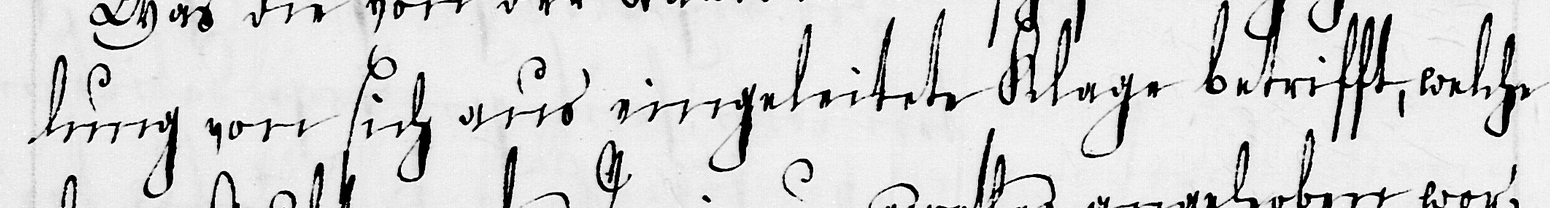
llung von sich aus eingeleitete Klage betrifft, welche
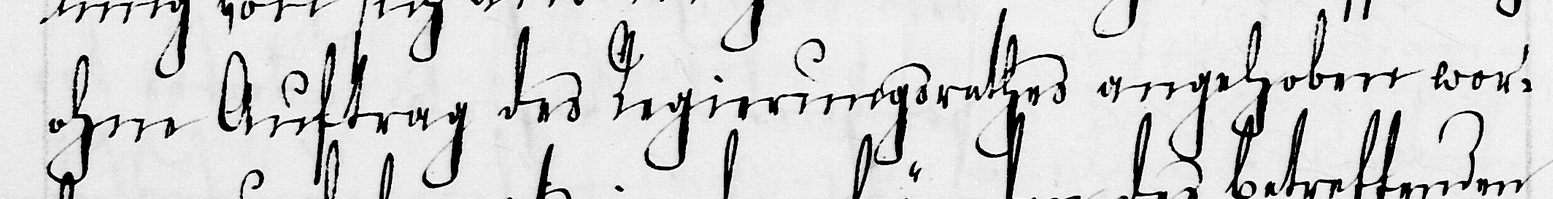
ohne Auftrag des Regierungsrathes angehoben wor¬
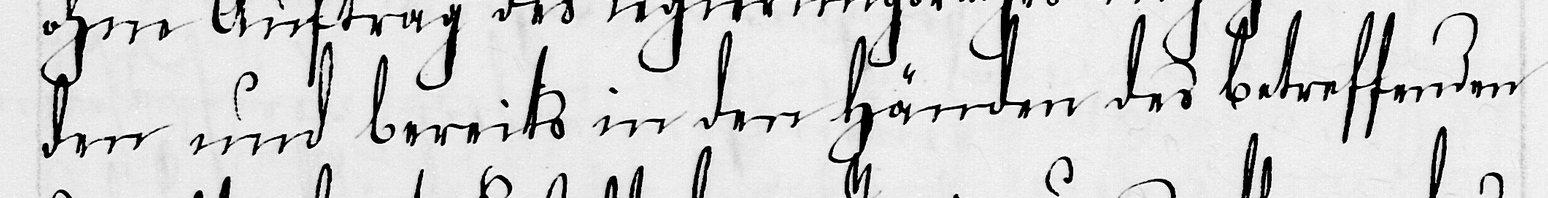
den und bereits in den Händen des betreffenden
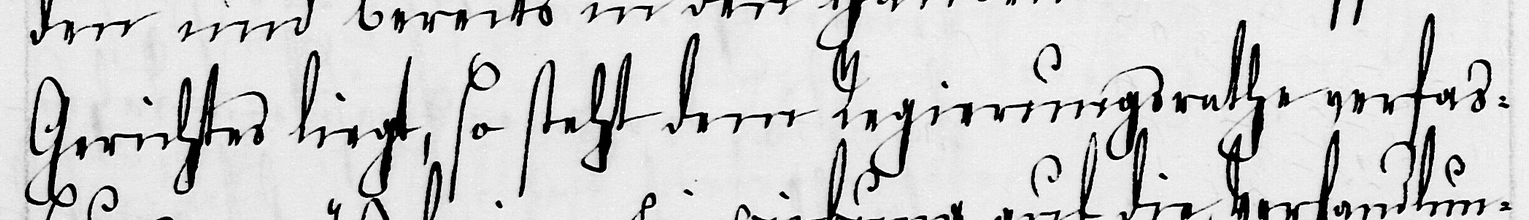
Gerichtes liegt, so steht dem Regierungsrathe verfaß¬
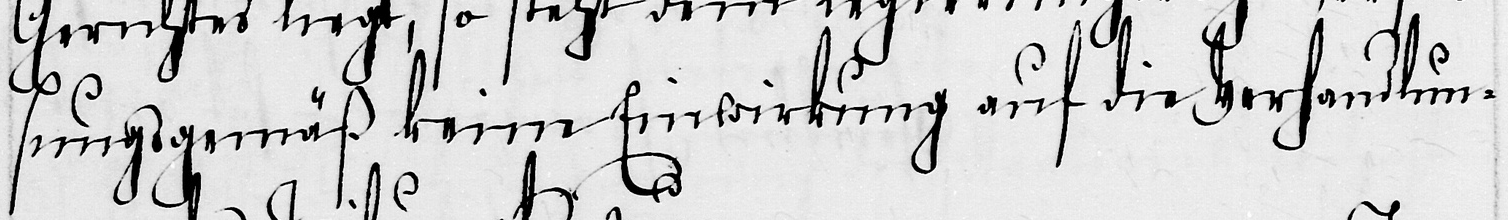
ungsgemäß keine Einwirkung auf die Verhandlun¬
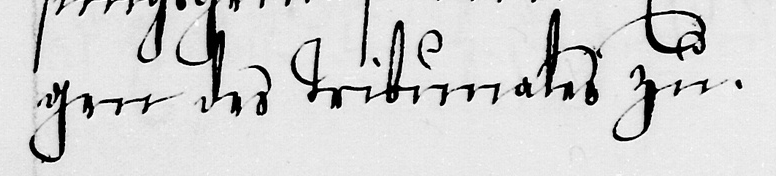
gen des Tribunales zu.
